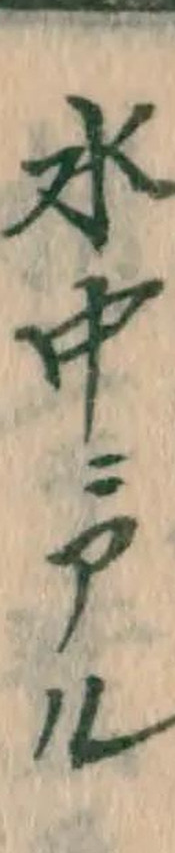水中ニアル
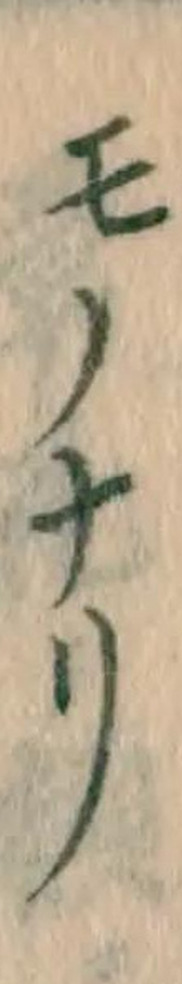モノナリ
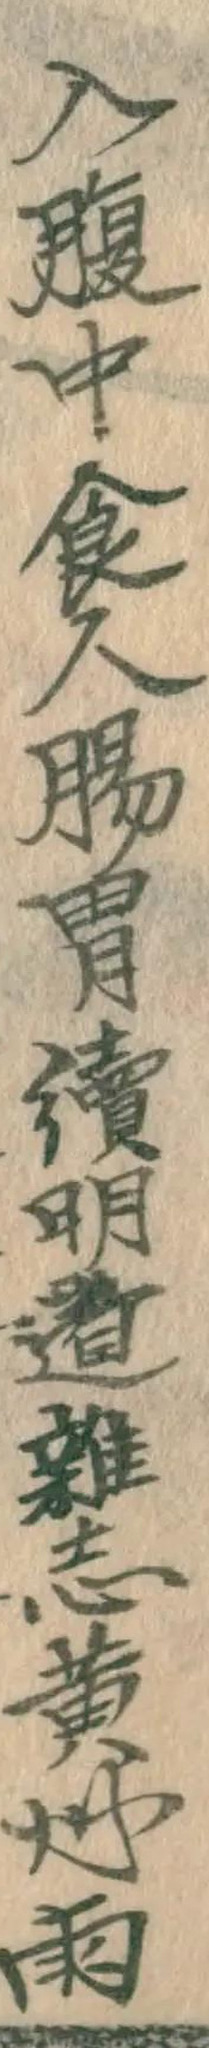入腹中食人腸胃續明道雑志黄州雨
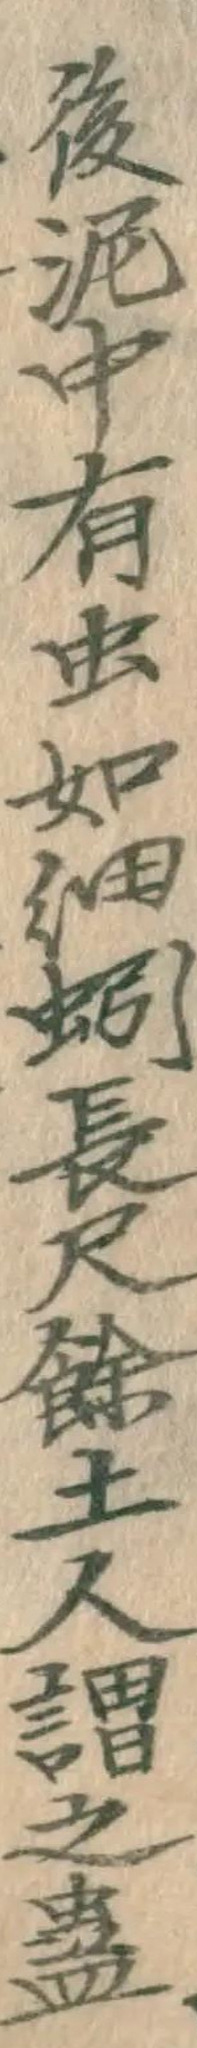後泥中有虫如細蚓長尺餘土人謂之蠱
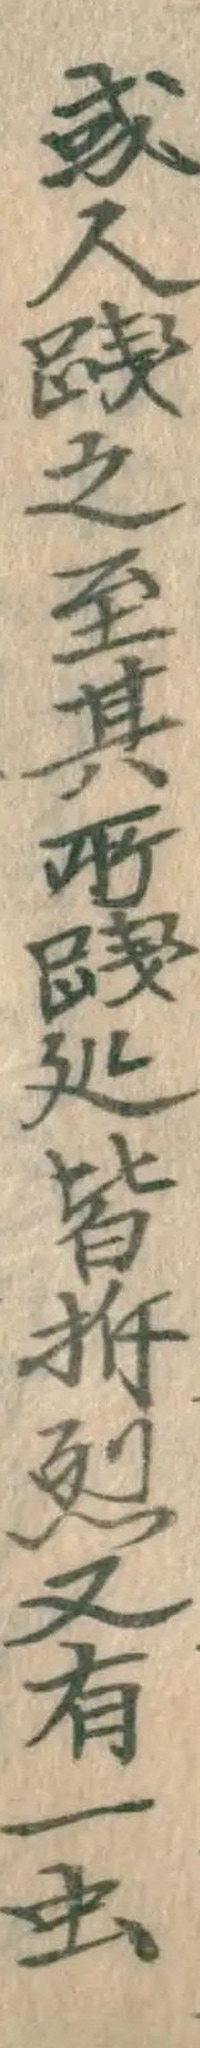或人践之至其所践処皆折烈又有一虫
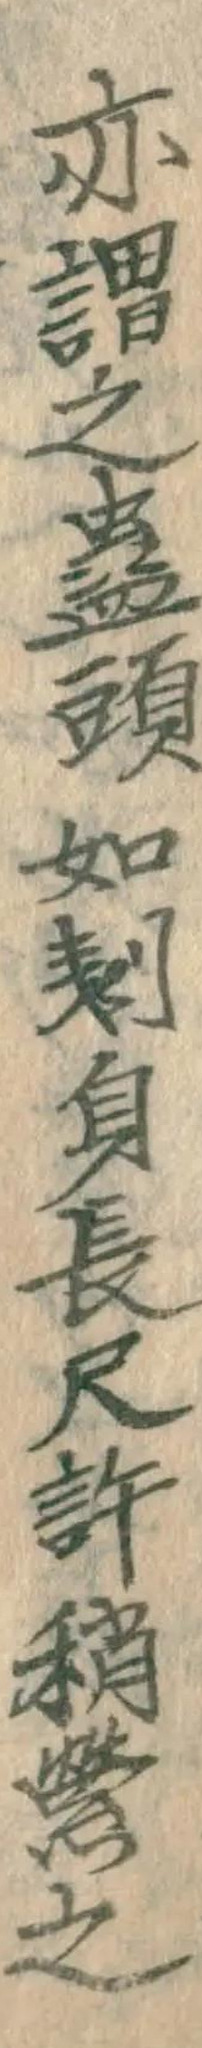亦謂之蠱頭如剗身長尺許稍縈之

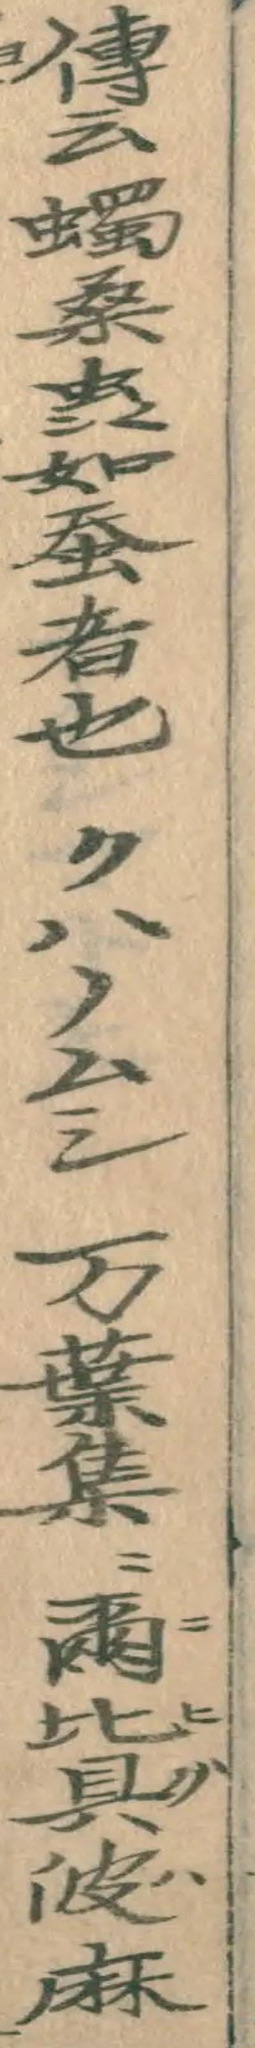蜎々者蠋傳云蠋桑蟲如蚕者也クハノムシ万葉集ニ爾比具波麻
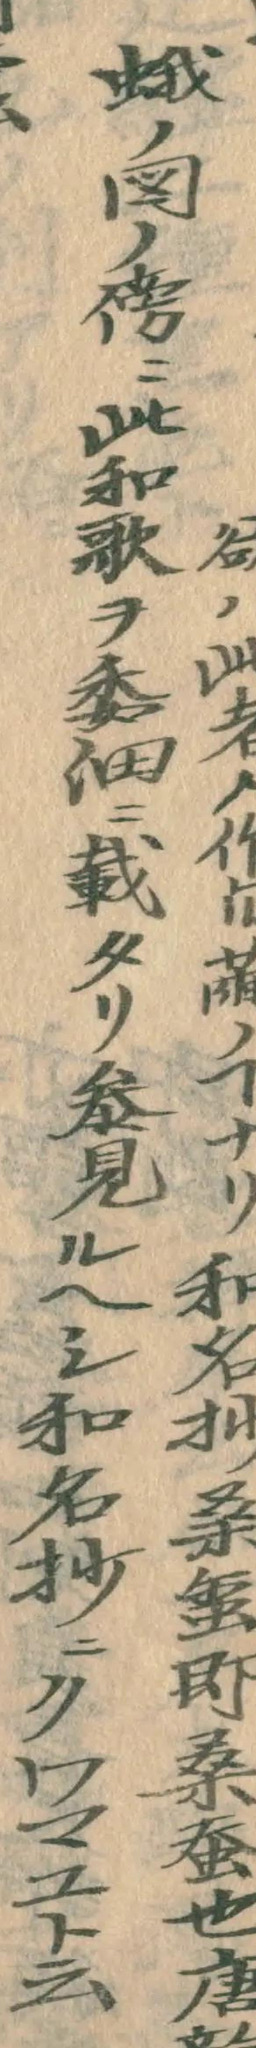蛾ノ図ノ傍ニ此和歌ヲ委細ニ載タリ参見ルヘシ和名抄ニクワマユト云
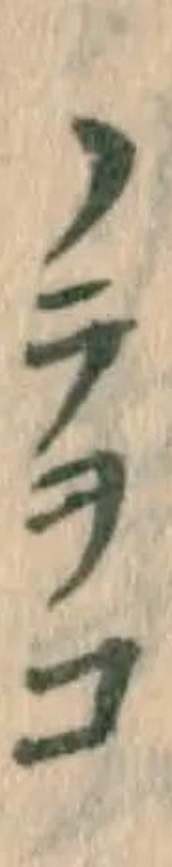ノラヲコ
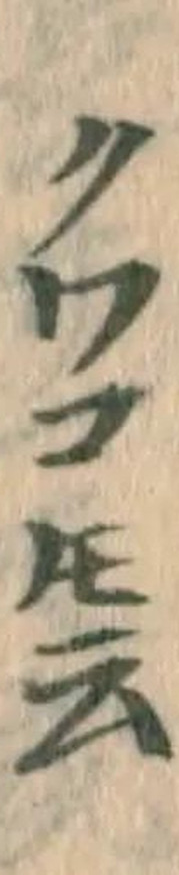クワコトモ云
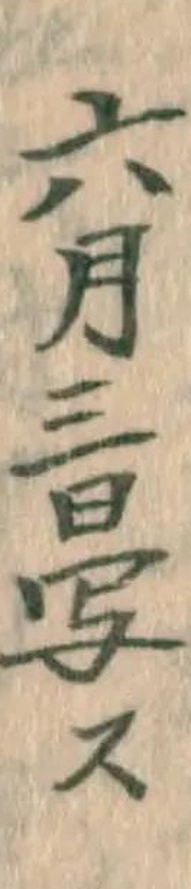六月三日写ス
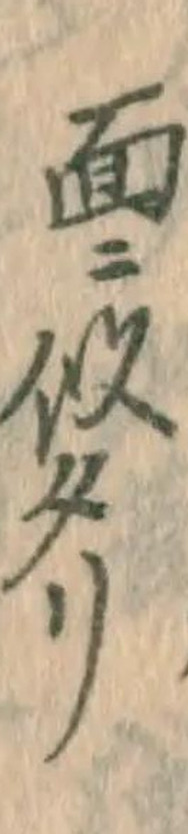面ニ似タリ
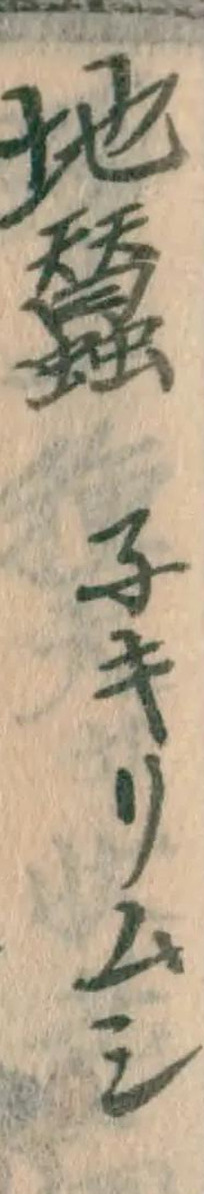地蠺ネキリムシ
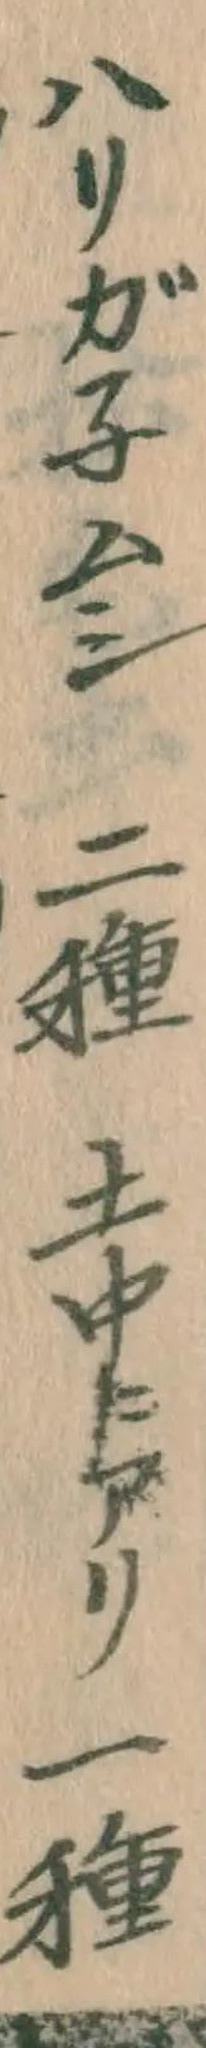ハリガネムシ二種土中ニアリ一種
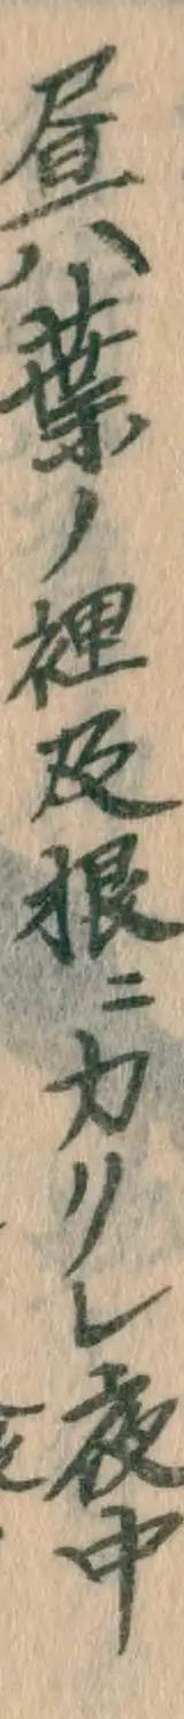昼ハ葉ノ裡及根ニカクレ夜中
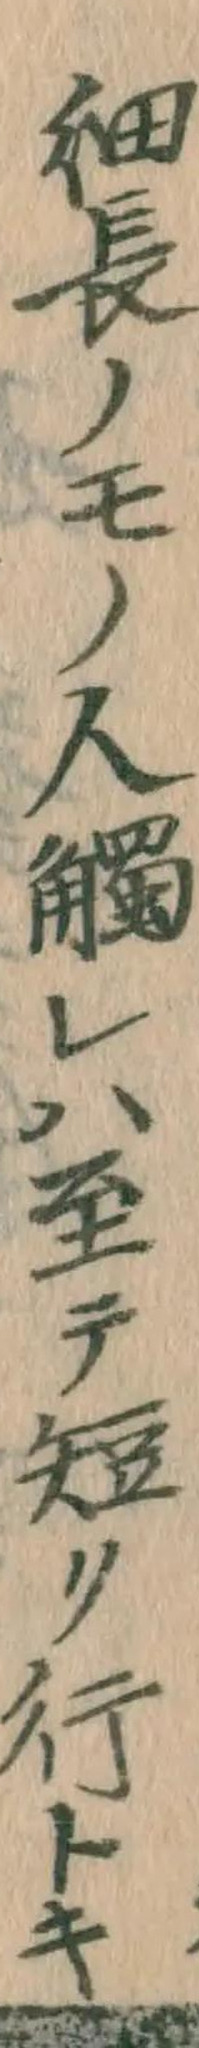細長ノモノ人觸レハ至テ短ク行トキ
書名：千蟲譜 3巻. [2]
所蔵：国立国会図書館 National Diet Library, JAPAN
